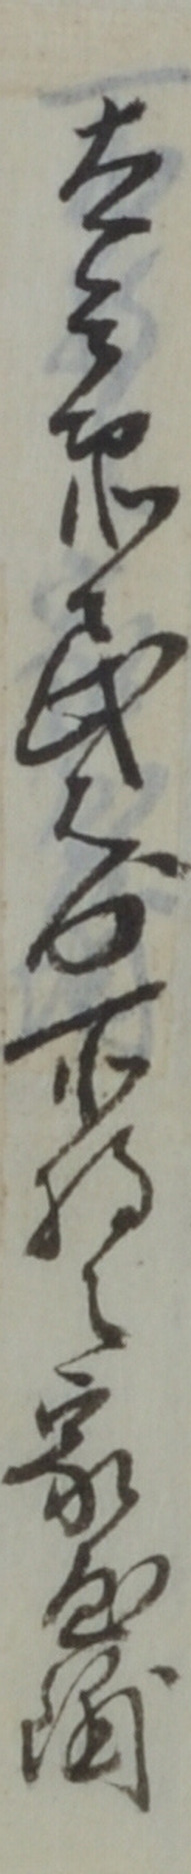太兵衛民右衛門所持之家屋鋪
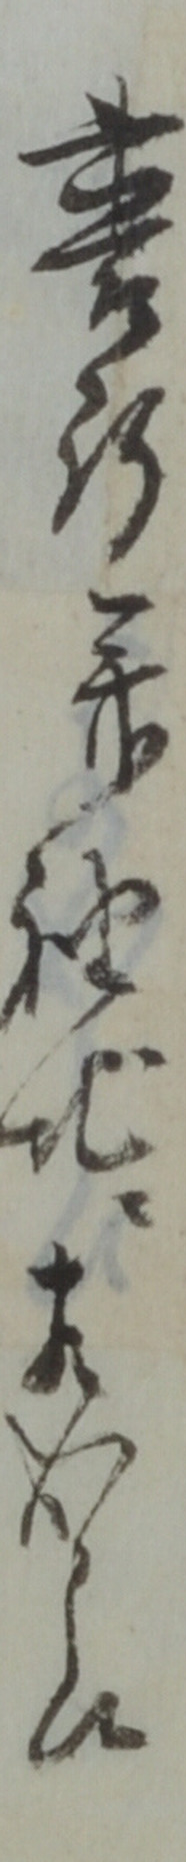裏行并袖地ニ相成申候
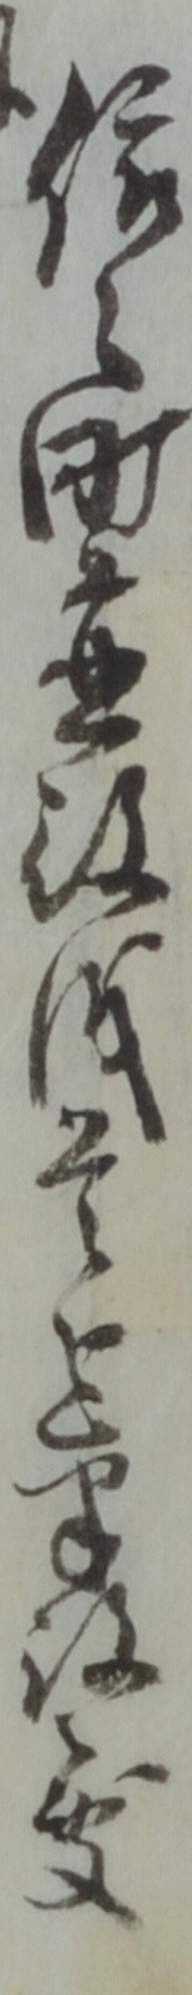依之町並役儀是迄半役之処
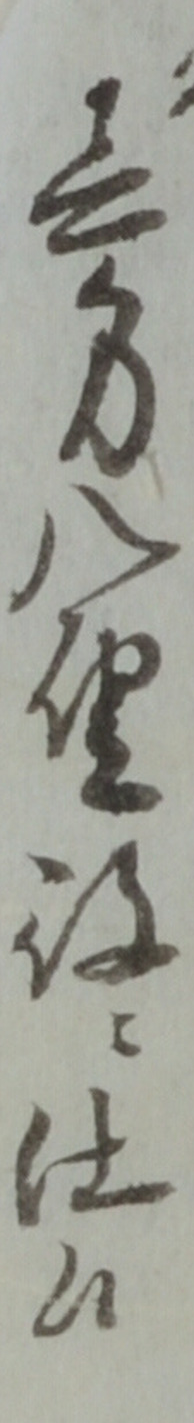已来壱分八厘役ニ仕候

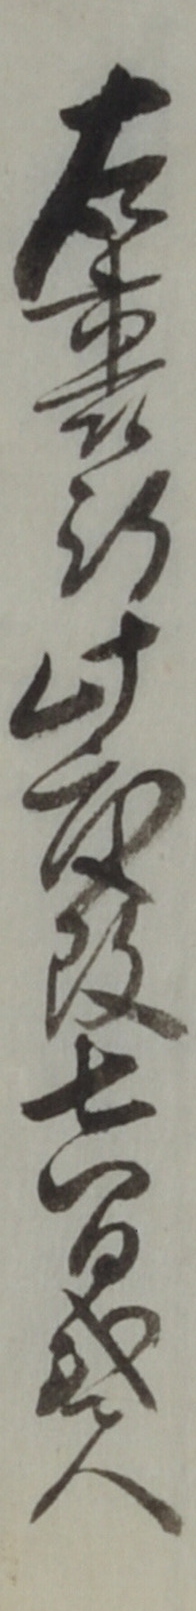右裏行此度改七間弐尺
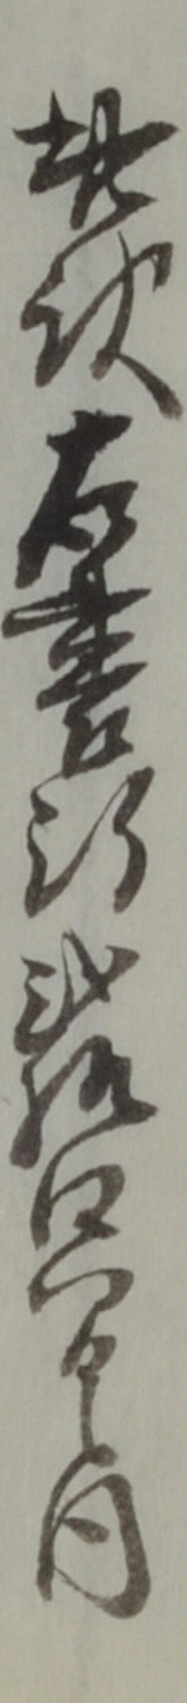此訳右裏行弐拾四間之内
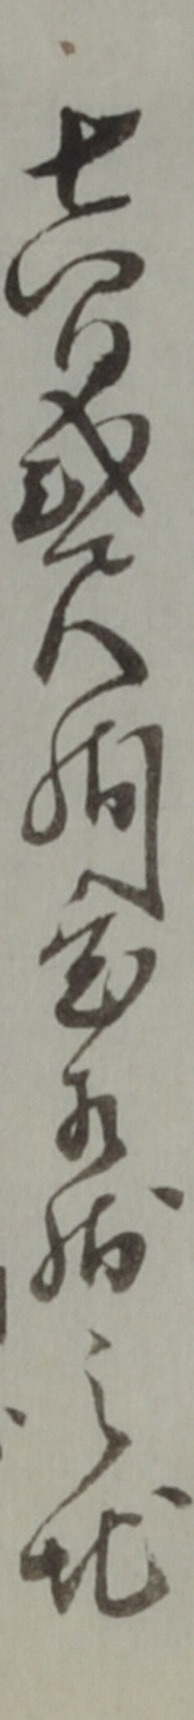七間弐尺残置相残之地
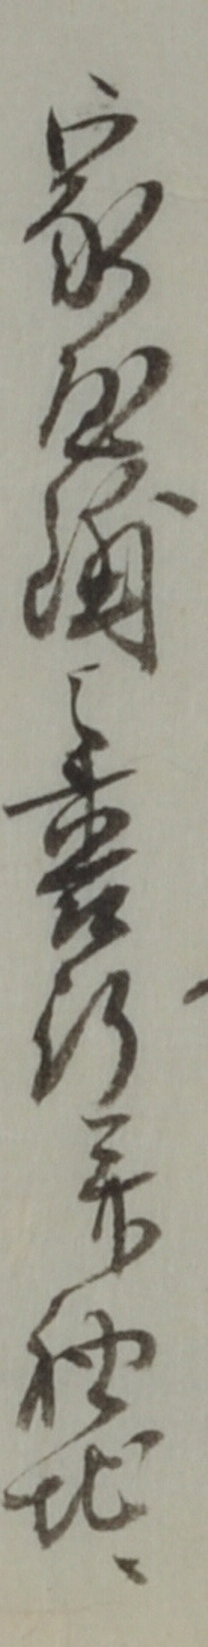家屋鋪之裏行并袖地ニ
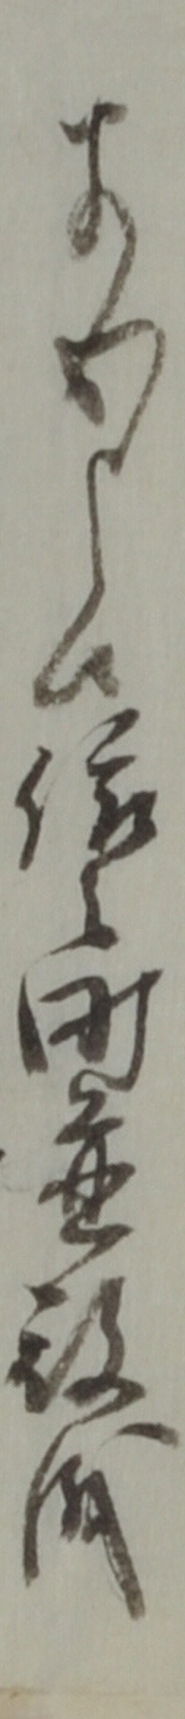相成申候依之町並役儀
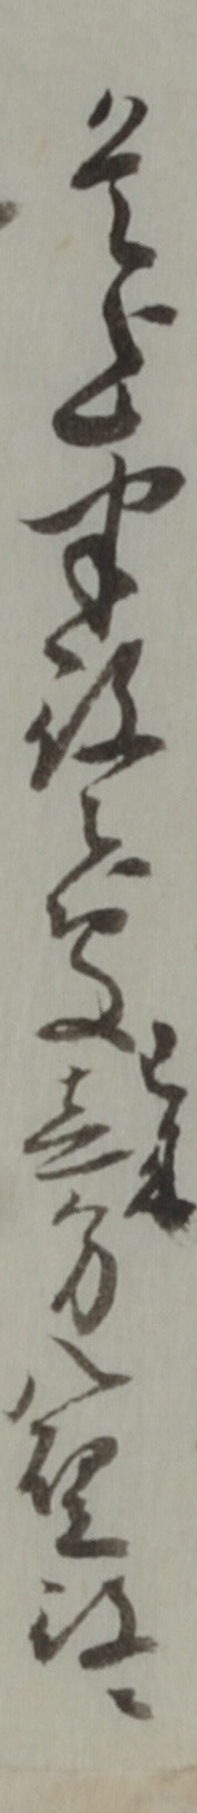是迄半役之処已来壱分八厘役ニ
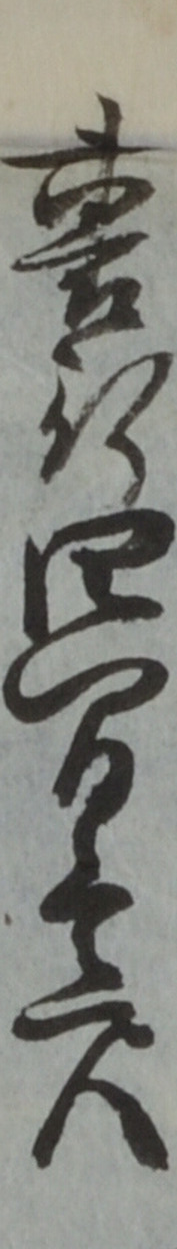裏行四間壱尺
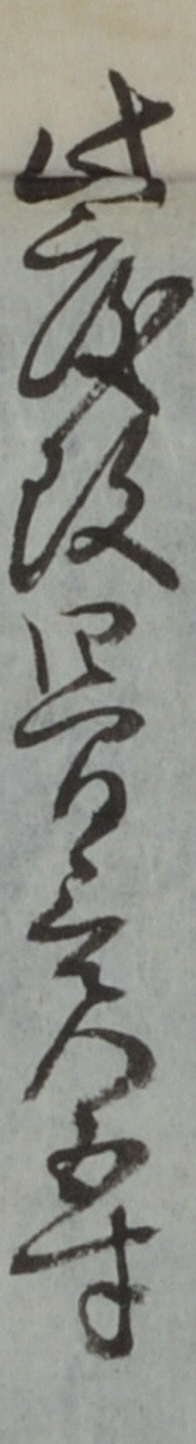此度改四間三尺五寸
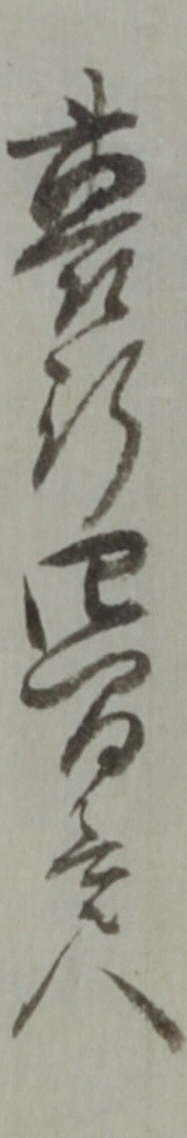裏行四間壱尺
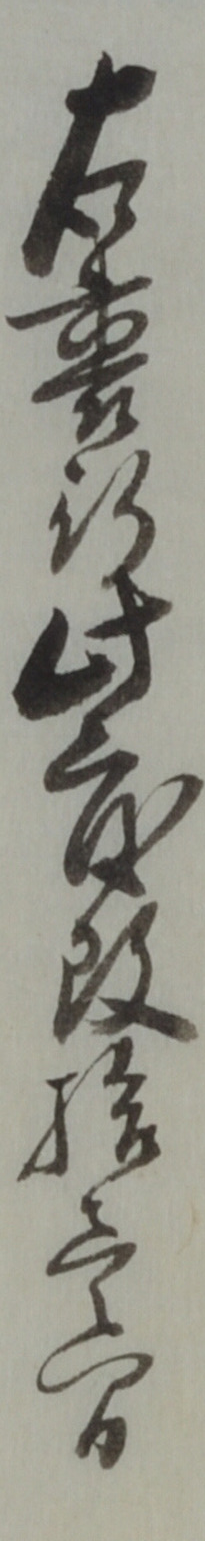右裏行此度改拾壱間
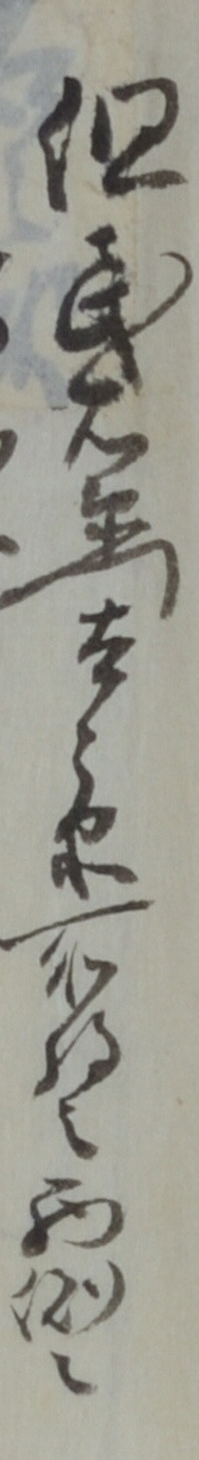但民右衛門太兵衛所持之西側之
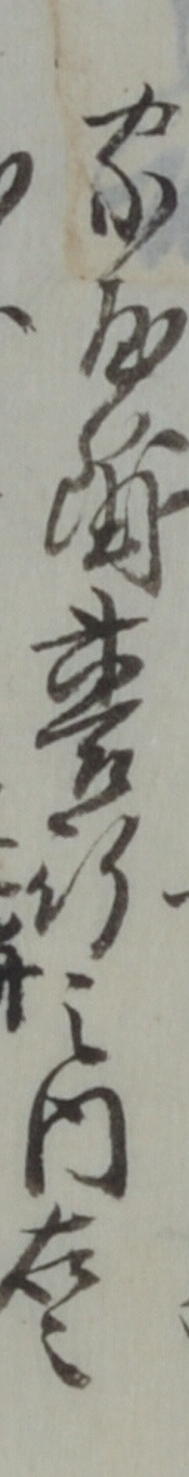家屋鋪裏行之内右之
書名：屋敷表口裏行書上
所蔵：伊那市立高遠町図書館・合同会社AMANE
